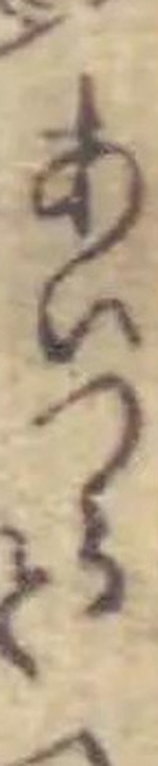あいつらと
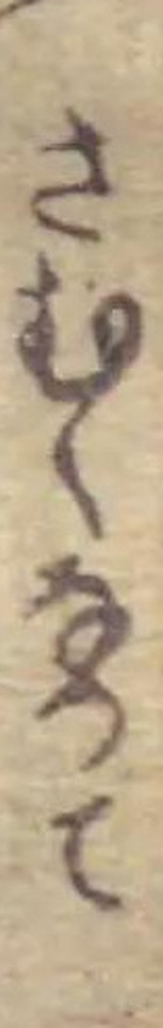さむくなつて
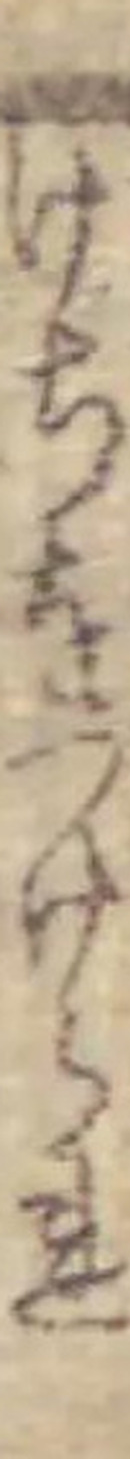けちをつけられ
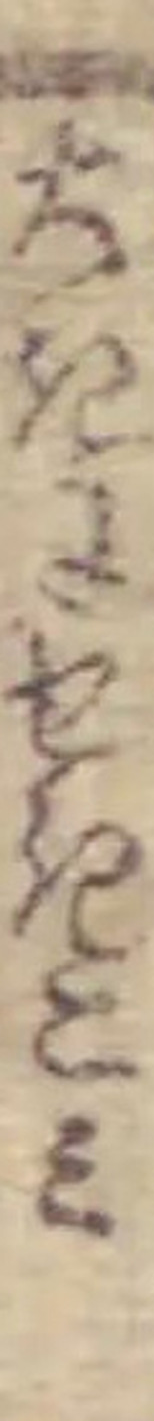大きにせきこみ
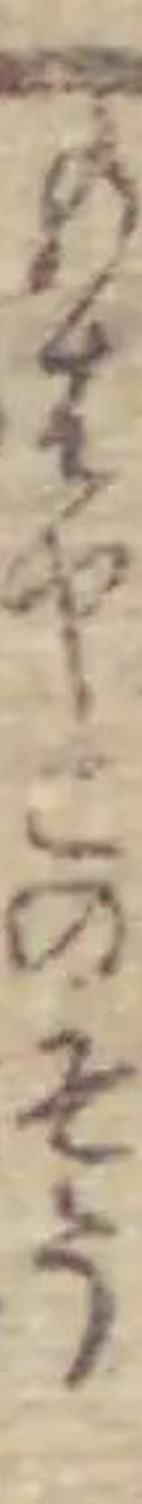もはやこのそう
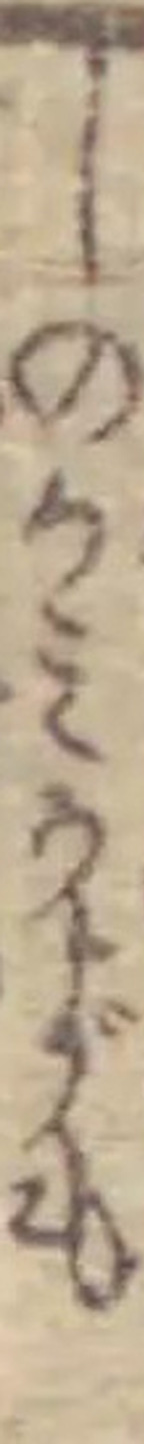しのかみかずも
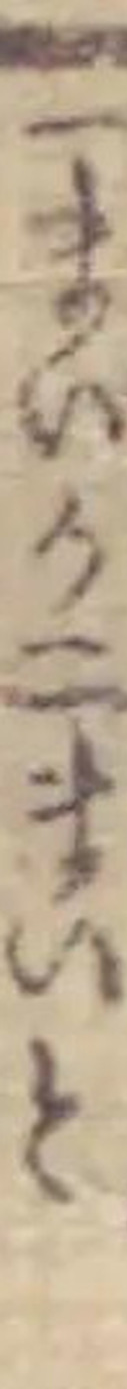一まいか二まいと
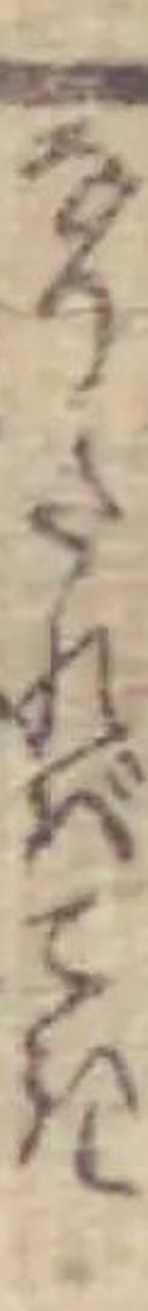なりたればてき
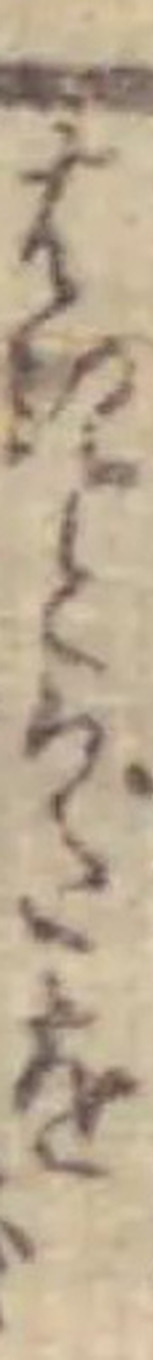はきとかたを
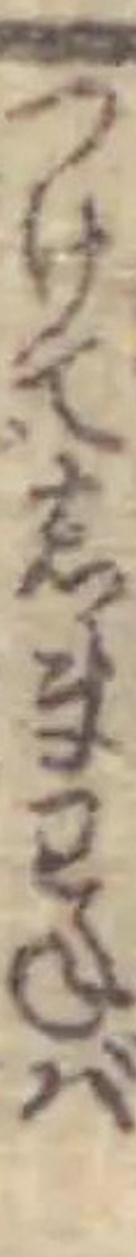つけてしまわねば
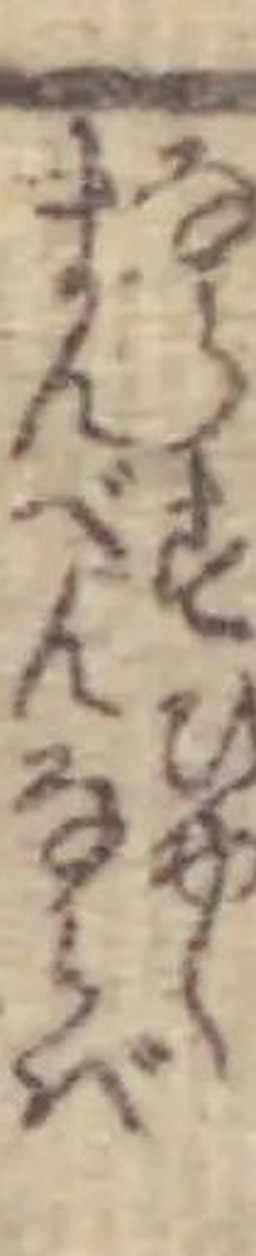まんべんならば
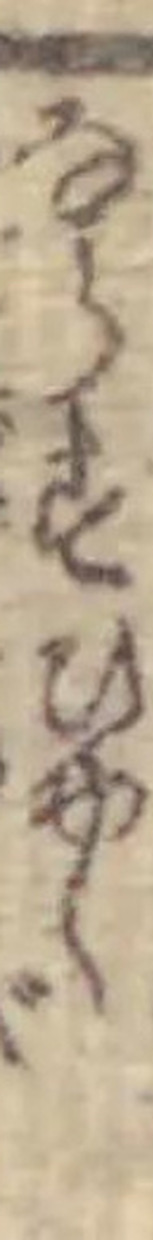ならずひやく
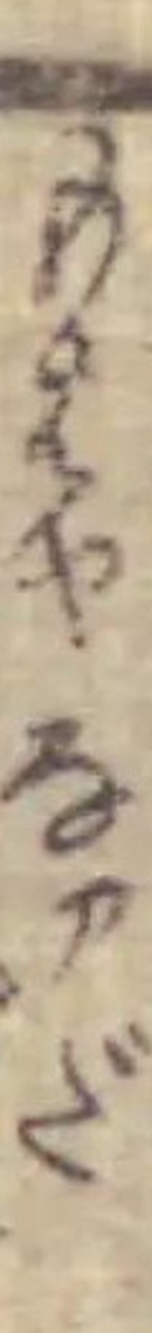もはやなァだ
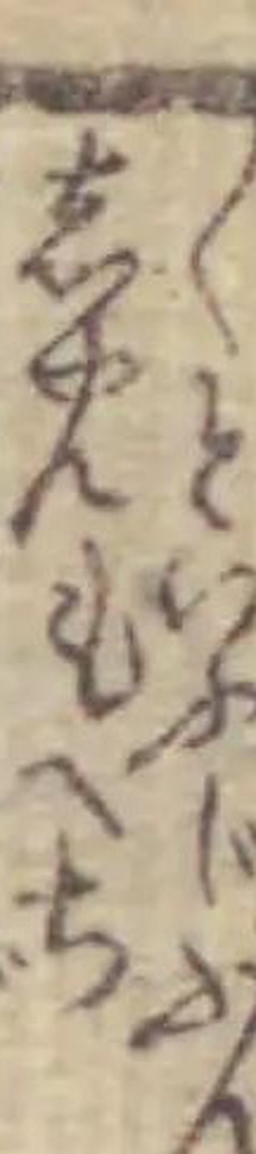しやんもへち
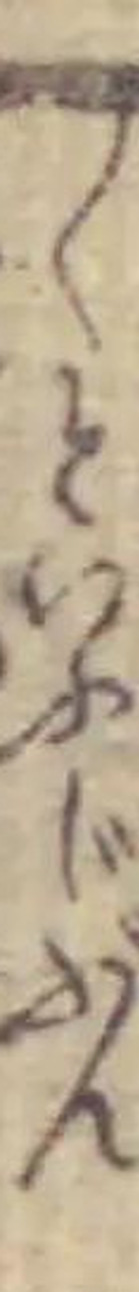〳〵といふじぶん
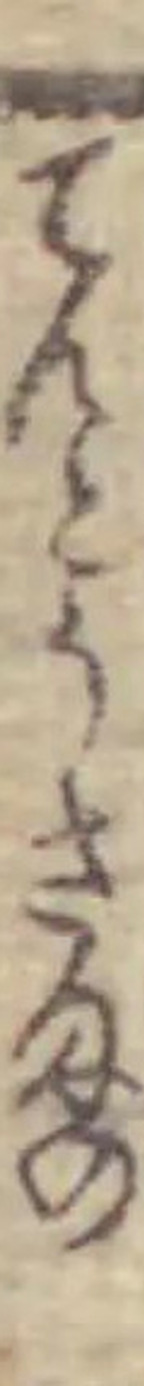てんとうさまの
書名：雨宮風宮出儘略縁記 3巻
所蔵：国立国会図書館 National Diet Library, JAPAN
